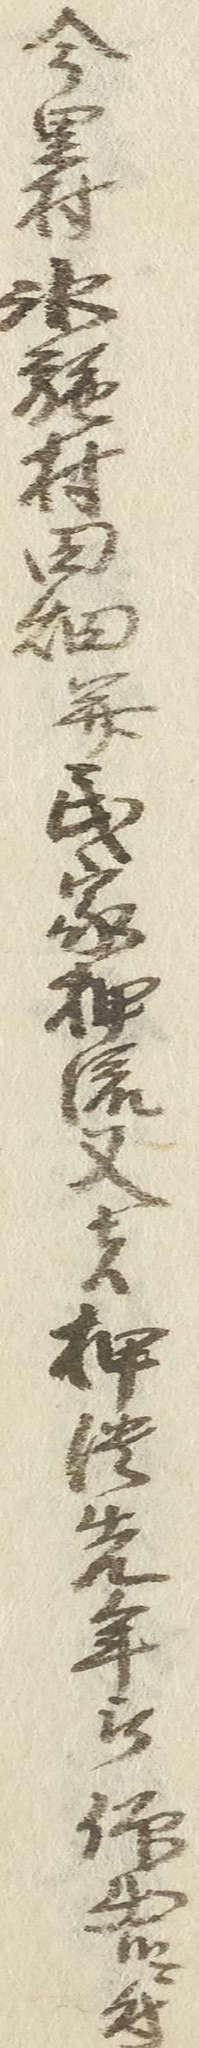今里村氷施村田畑并民家押流又は押潰先年被仰出候二付

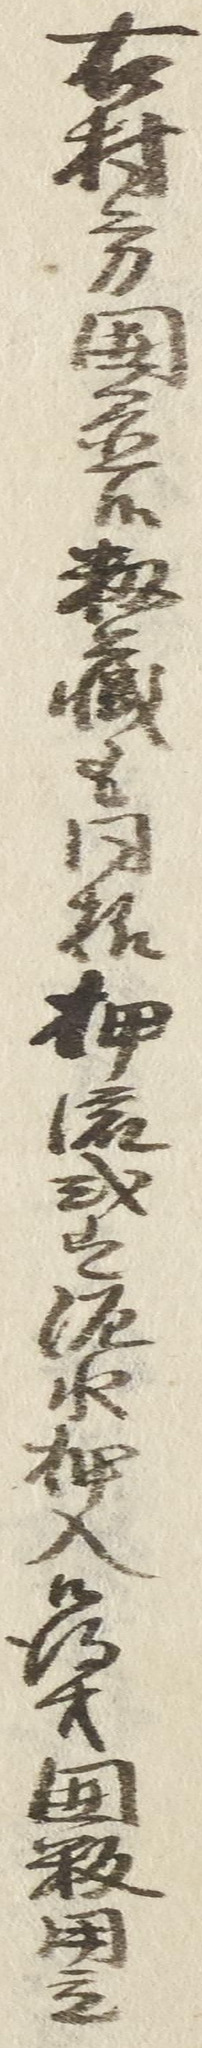右村方囲置候籾蔵も同様押流或は泥水押入候得共囲籾用立
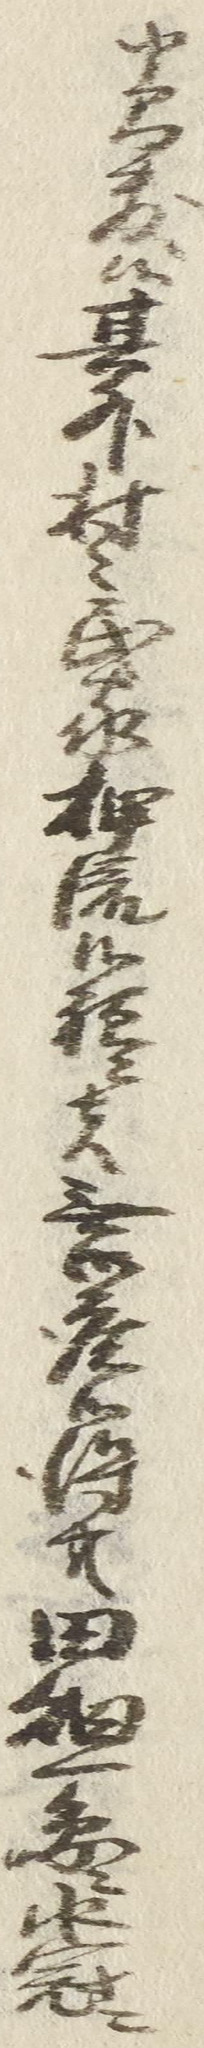申間敷候其外村々民家押流候程ニは無御座候得共田畑一円ニ水冠
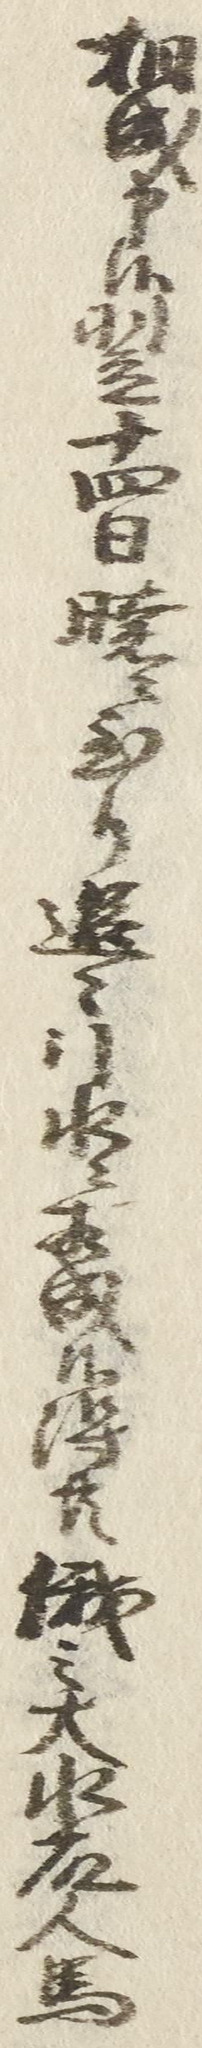相成申候翌十四日暁ニ至り追々引水ニ相成候得共俄之大水故人馬
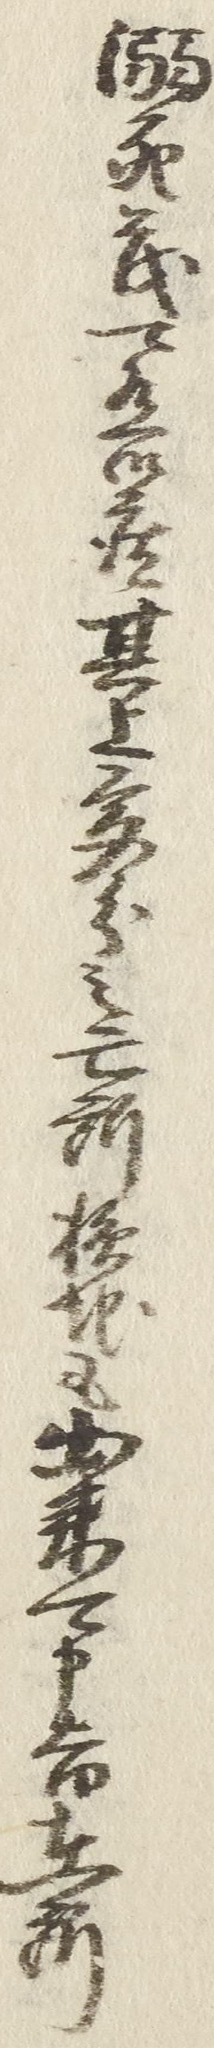溺死も可有御座候其上多分之亡所損地も出来可申旨在所
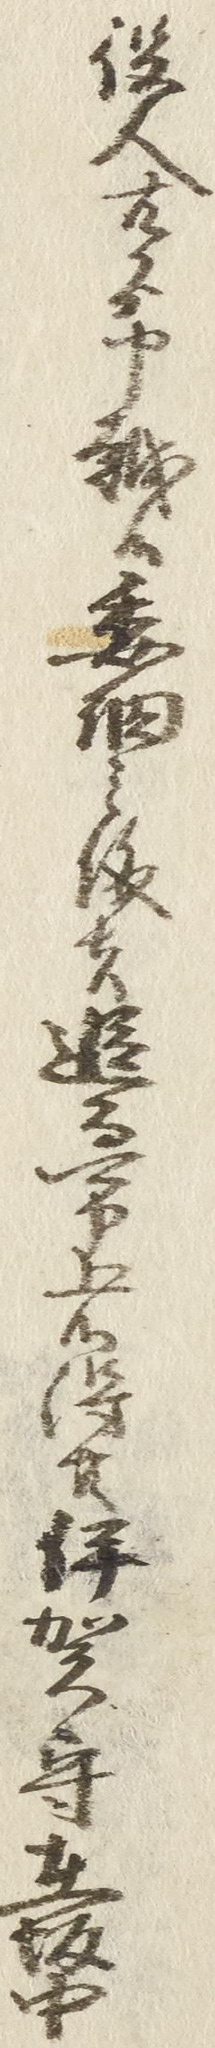役人共ゟ申越候委細之儀は追而可申上候得共伊賀守在坂中
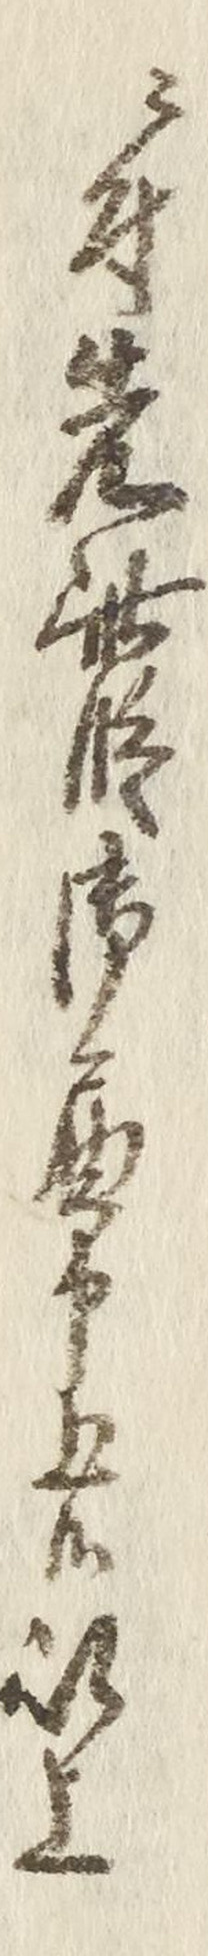ニ付先此段御届申上候以上
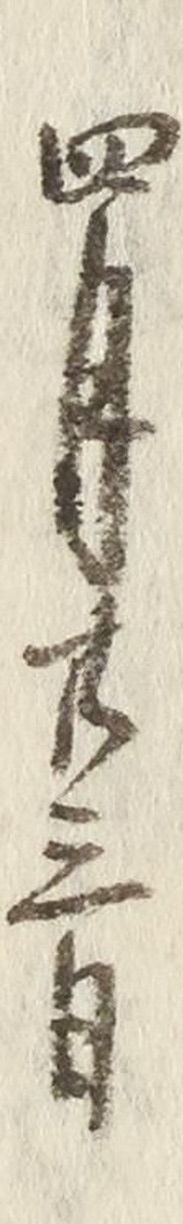四月廿三日
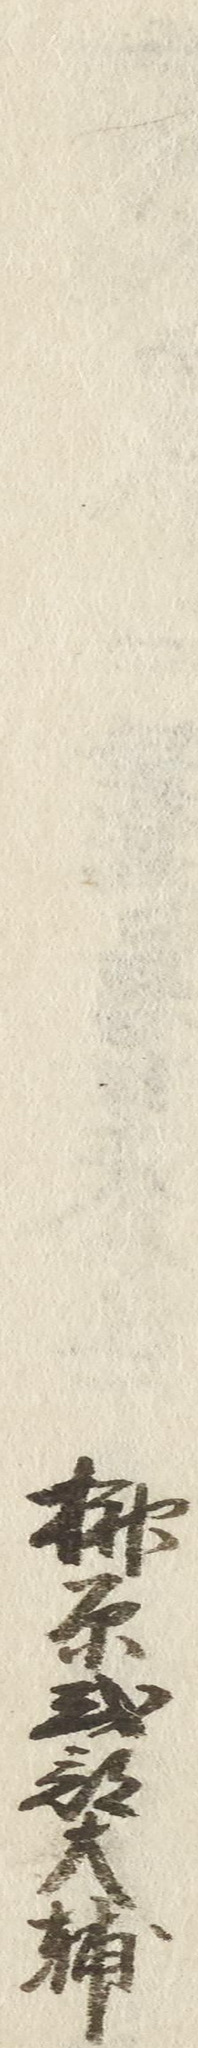榊原式部大輔
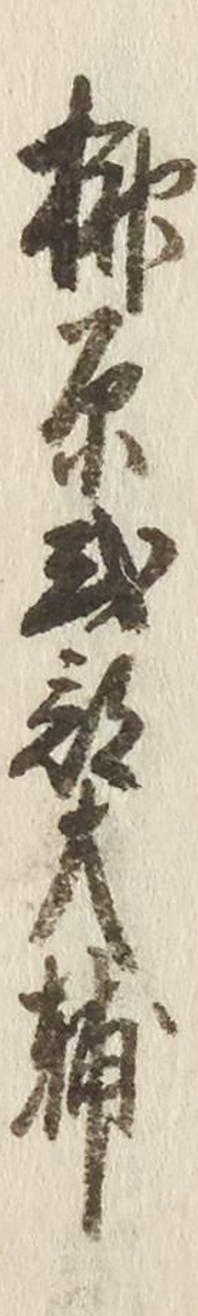榊原式部大輔
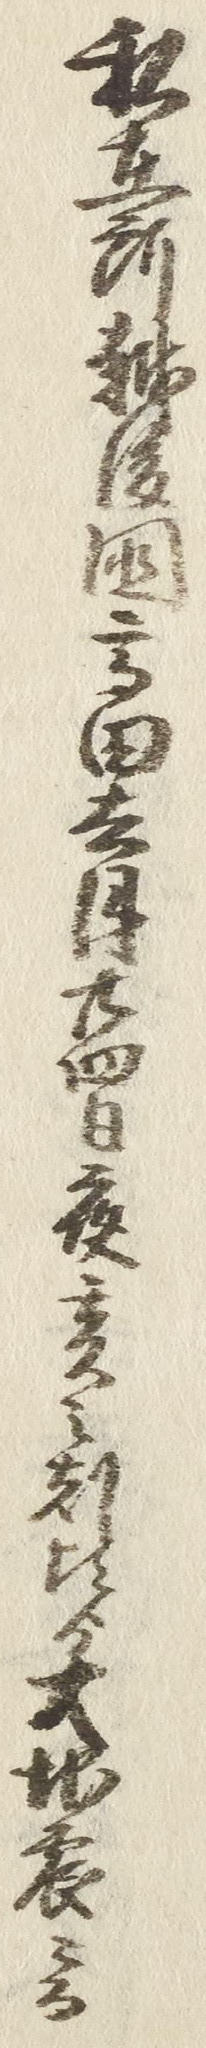私在所越後国高田去月廿四日夜亥之刻頃ゟ大地震ニ而
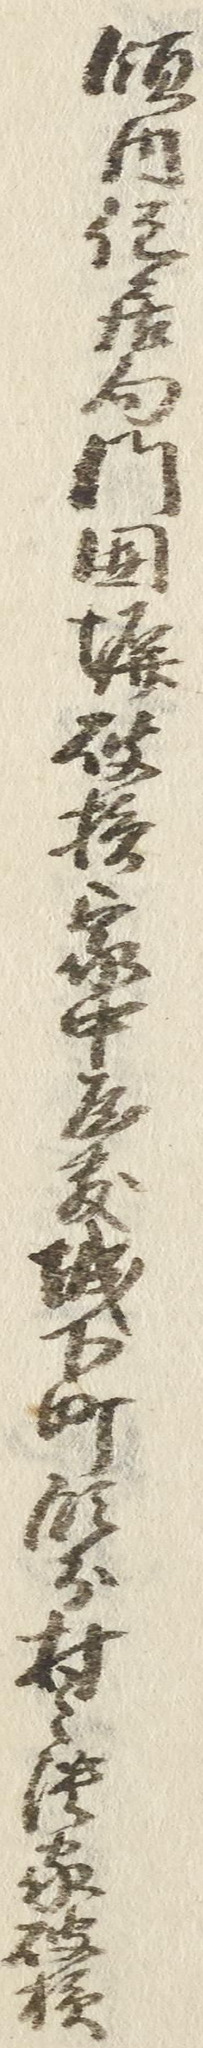領内住居向門囲塀破損家中屋敷城下町領分村々潰家破損
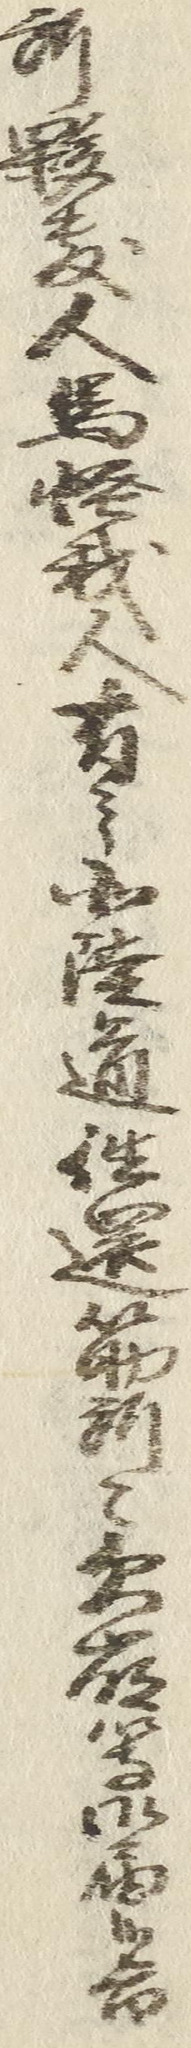所夥敷人馬怪我人有之北陸道往還筋所々欠崩等御届候節
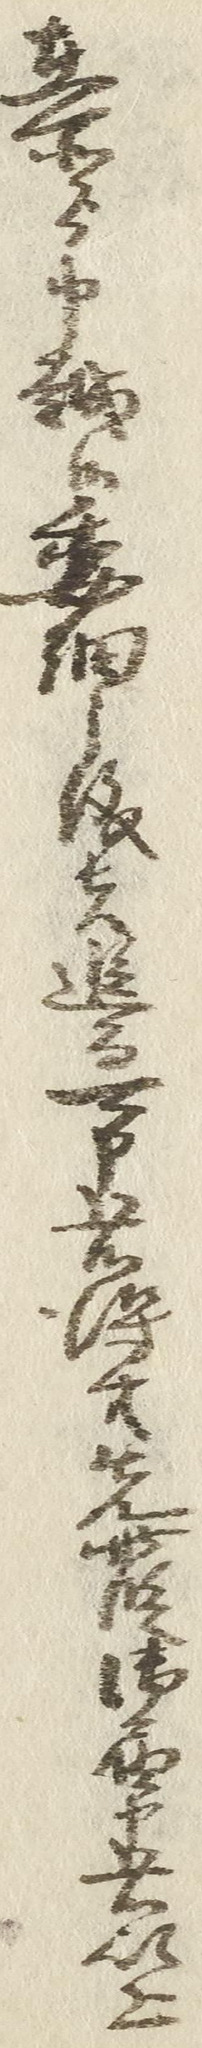在所ゟ申越候委細之儀は追而可申上候得共先此段御届申上候以上
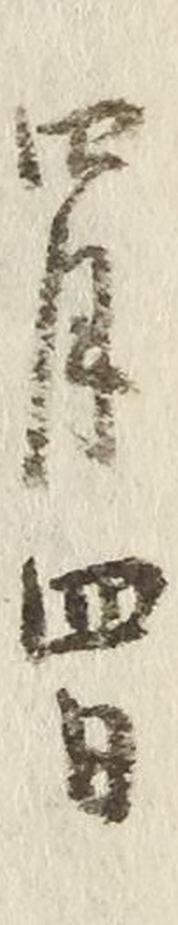四月七日
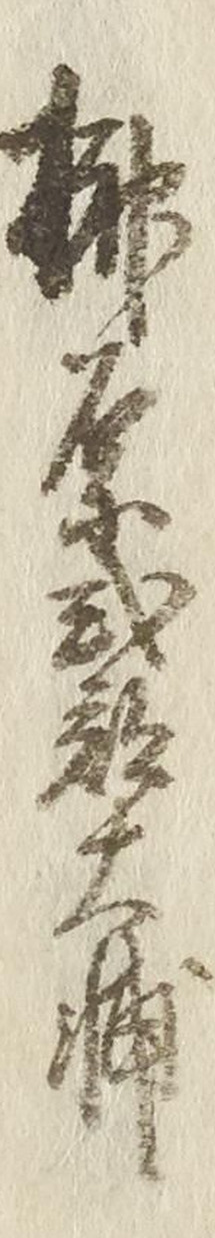榊原式部大輔
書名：従往古地震御届書記誌之一
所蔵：東京大学地震研究所図書室 Earthquake Research Institute Library, The University of Tokyo, JAPAN
